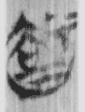智
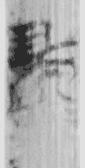耑
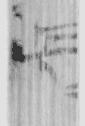長
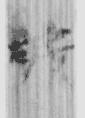弗
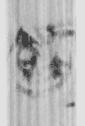智
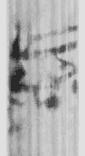忘
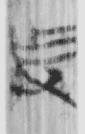拃
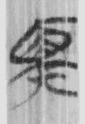{角大}
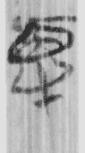{角牛}
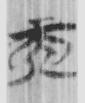而
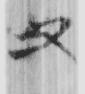又
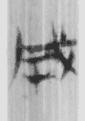成
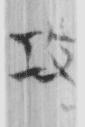攻
